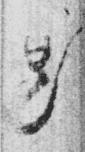也
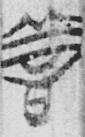善
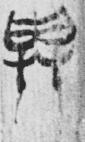與
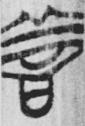善
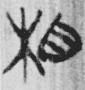相
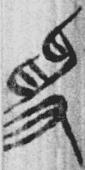受
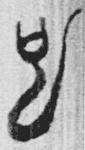也
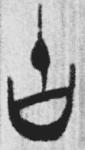古（故）
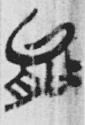能
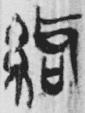○（治）
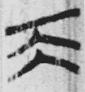天
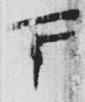下
